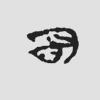明
